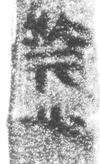箕
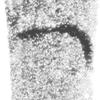一
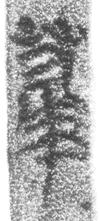帚
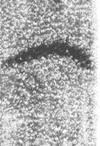一
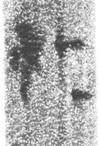一
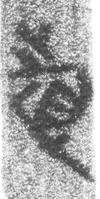首
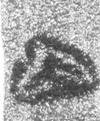裀（絪）
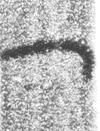一
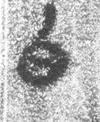白（袙）
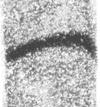一
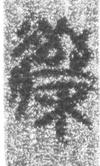○（縉）
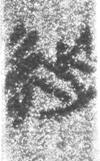紫
